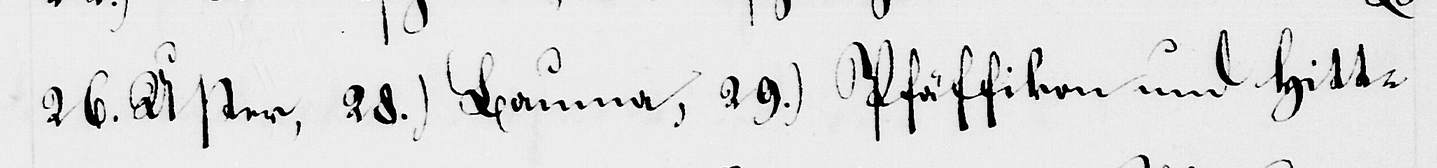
26.[)] Uster, 28.) Bauma, 29.) Pfäffikon und Hitt¬
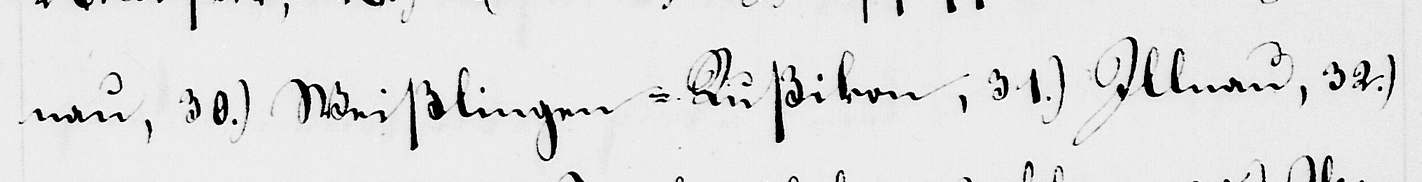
nau, 30.) Weißlingen-Rußikon, 31.) Illnau, 32.)
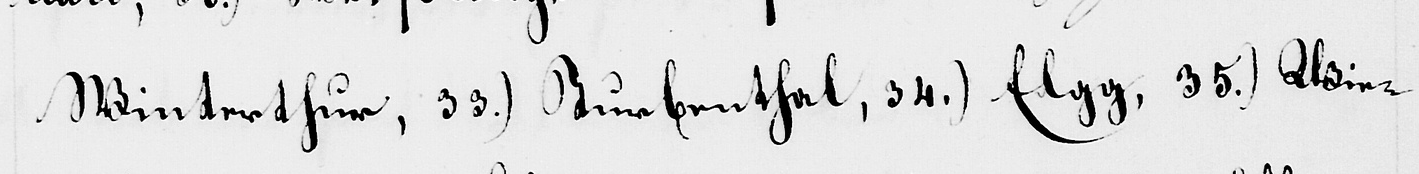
Winterthur, 33.) Turbenthal, 34.) Elgg, 35.) Wie¬
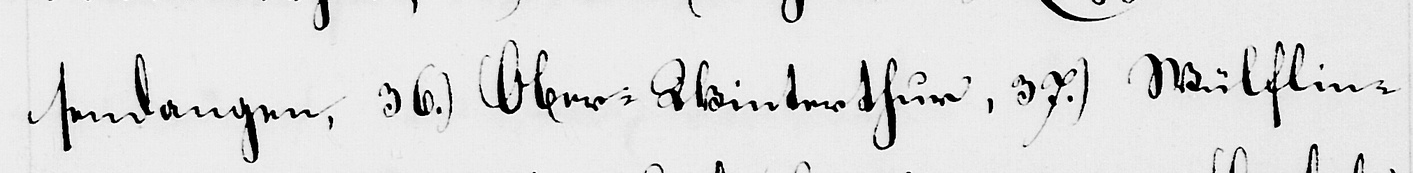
sendangen, 36.) Ober-Winterthur, 37.) Wülflin¬
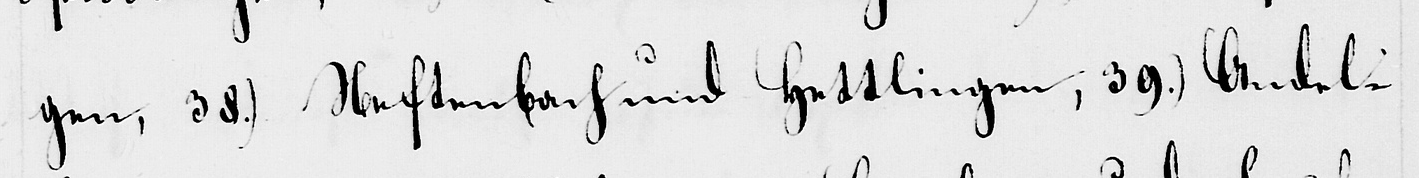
gen, 38.) Neftenbach und Hettlingen, 39.) Andel¬
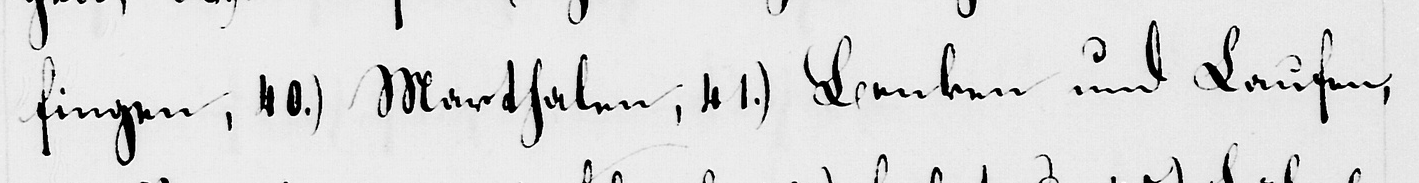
fingen, 40.) Marthalen, 41.) Benken und Laufen,
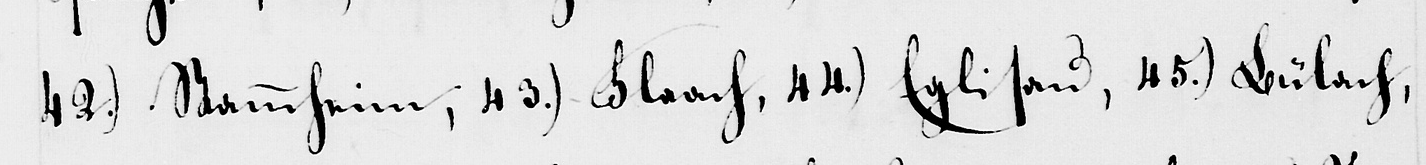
42.) Stammheim, 43.) Flaach, 44.) Eglisau, 45.) Bülach,
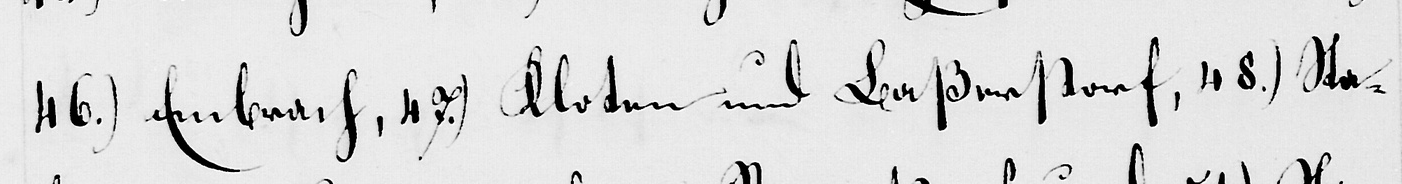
46.) Embrach, 477.) Kloten und Baßersdorf, 48.) Sta¬
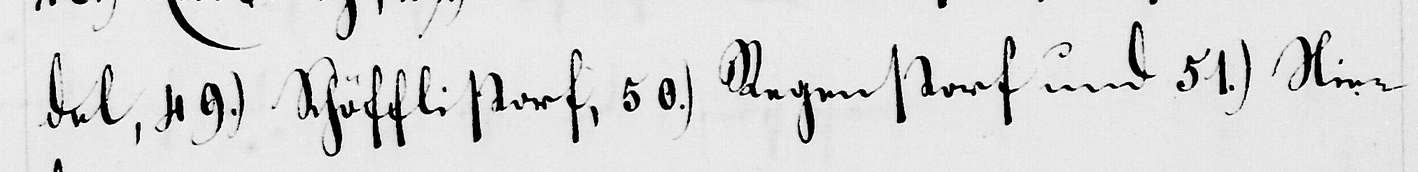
del, 49.) Schöfflisdorf, 50.) Regensdorf und 51.) Nie¬
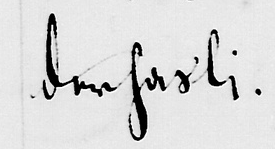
derhasli.
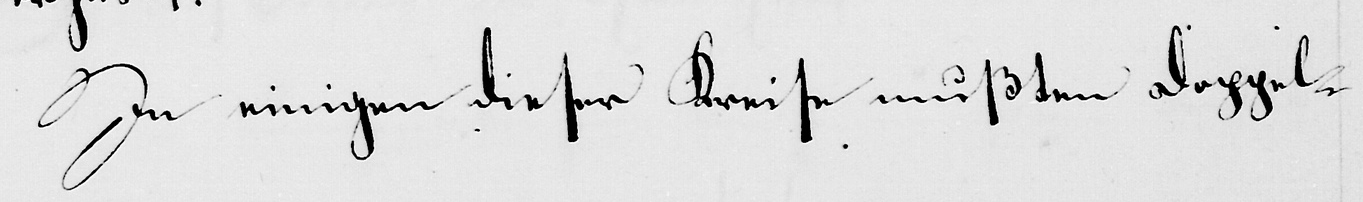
In einigen dieser Kreise mußten Doppel-
